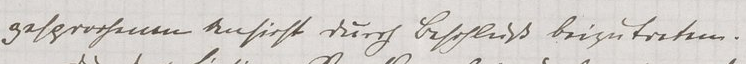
gesprochenen Ansicht durch Beschluß beizutreten.
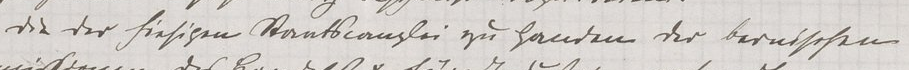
Die der hiesigen Staatscanzlei zu Handen der bernischen
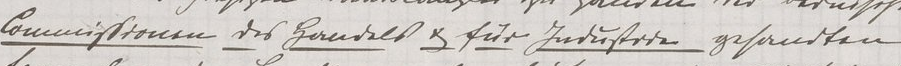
Commißionen des Handels & für Industrie gesandten
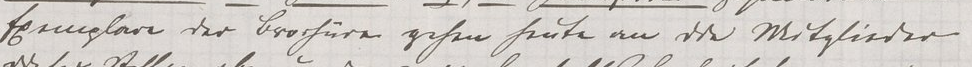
Exemplare der Brochüre gehen heute an die Mitglieder
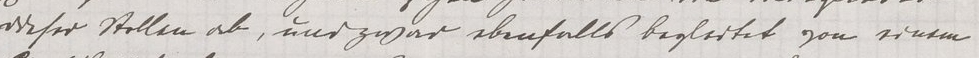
dieser Stellen ab, und zwar ebenfalls begleitet von einem
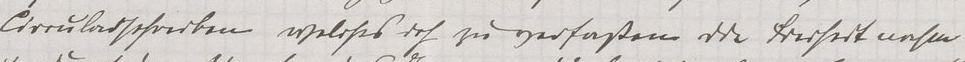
Circularschreiben welches ich zu verfaßen die Freiheit nahm
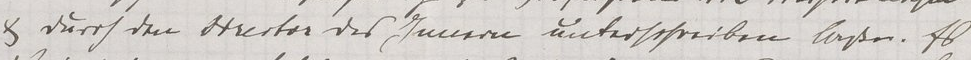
& durch den Director des Innern unterschreiben laße. Es
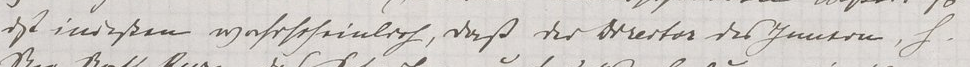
ist indeßen wahrscheinlich, daß der Director des Innern, H.
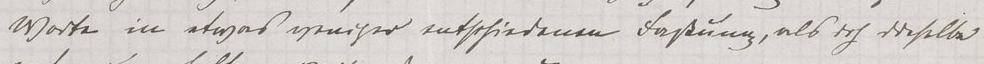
Worte in etwas weniger entschiedenen Faßung, als ich dieselbe
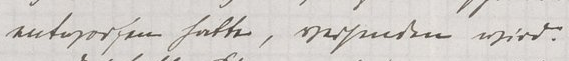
entworfen hatte, versenden wird.
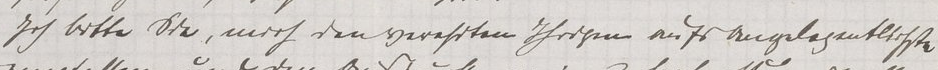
Ich bitte Sie, mich den verehrten Ihrigen aufs Angelegentlichste
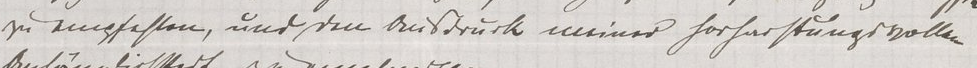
zu empfehlen, und den Ausdruck meiner hochachtungsvollen
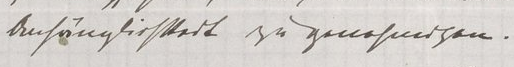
Anhänglichkeit zu genehmigen.
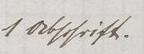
1 Abschrift.
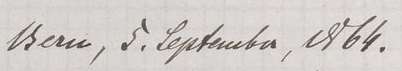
Bern, 5. September, 1864.
